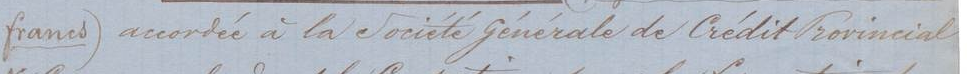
francs) accordée à la Société Générale de Crédit Provincial
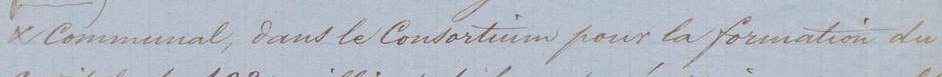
& Communal, dans le Consortium pour la formation du
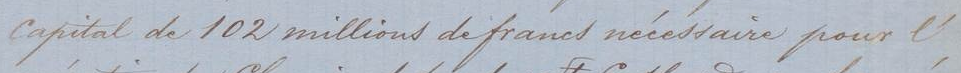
Capital de 102 millions de francs nécessaire pour l'
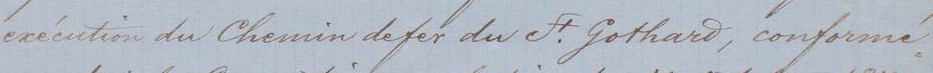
exécution du Chemin de fer du St Gothard, conformé-
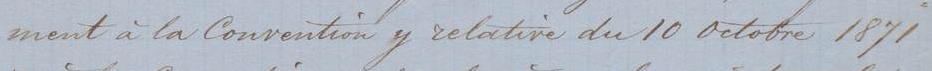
ment à la Convention y relative du 10 Octobre 1871
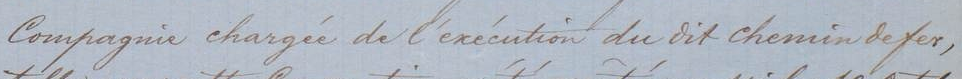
Compagnie chargée de l'exécution du dit Chemin de fer,
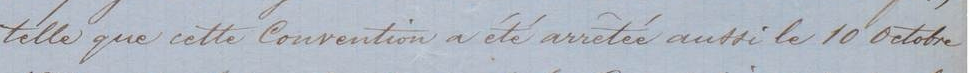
telle que cette Convention a été arrêtée aussi le 10 Octobre
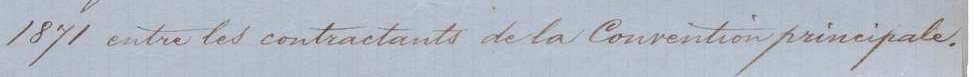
1871 entre les contractants de la Convention principale.
